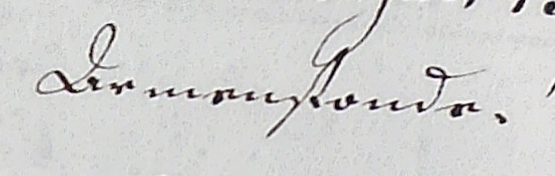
Armenfonde.
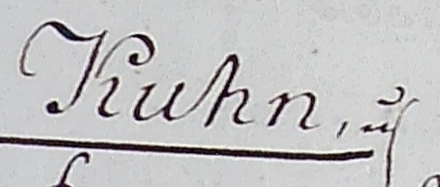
Kuhn, u
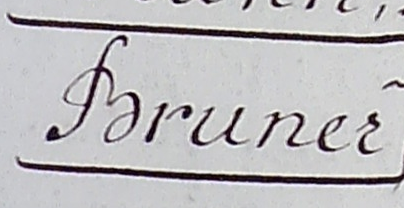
Bruner
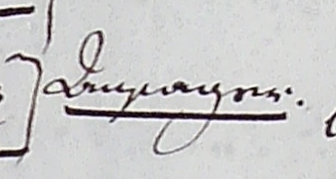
Ansager.
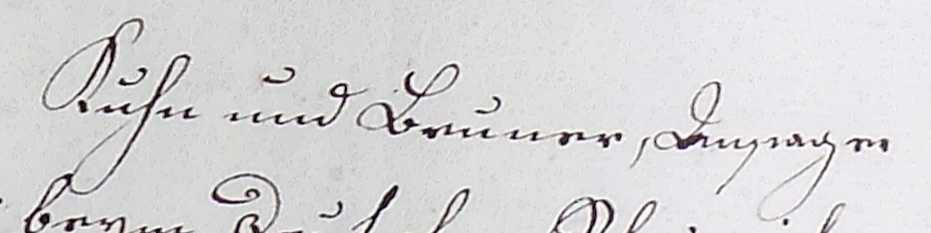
Kuhn und Bruner, Ansager
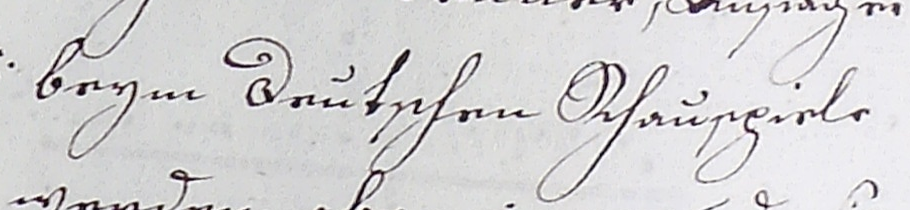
beym deutschen Schauspiele
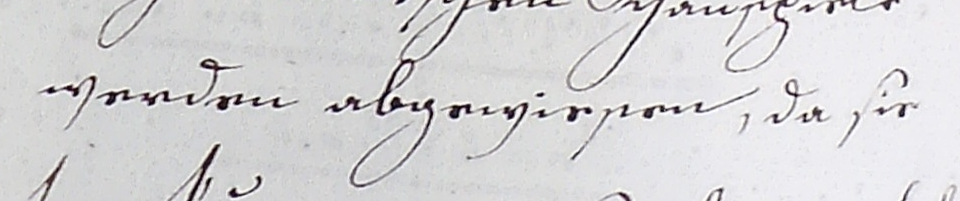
werden abgewiesen, da sie
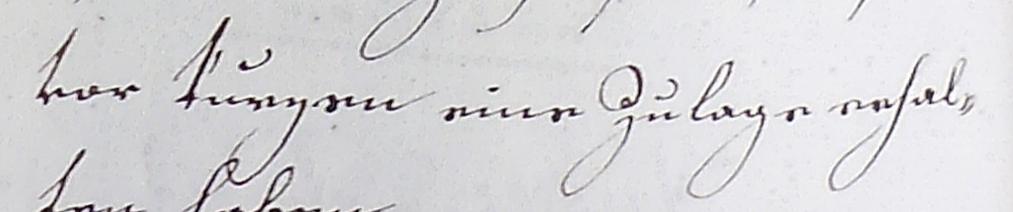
vor kurzen eine Zulage erhal¬
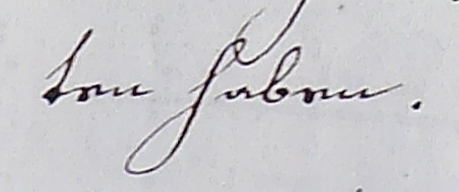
ten haben.
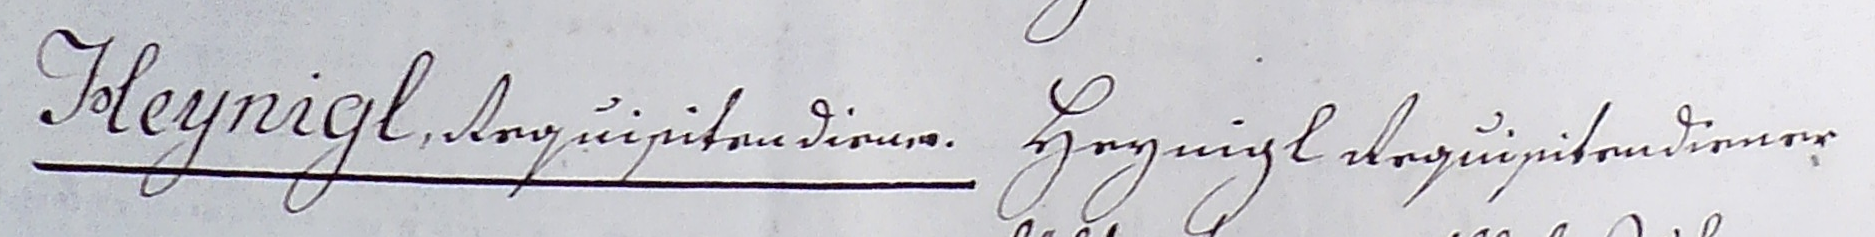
Heynigl, Requisitendiener. Heynigl Requisitendiener
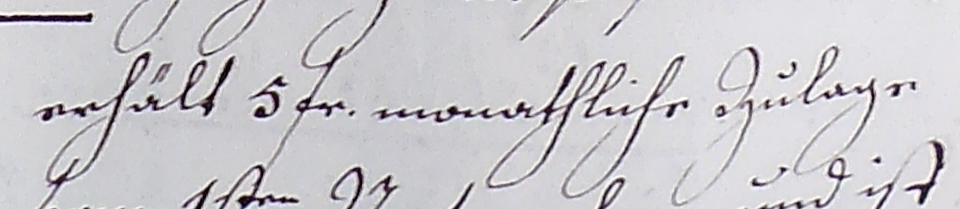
erhält 5fr. monathliche Zulage
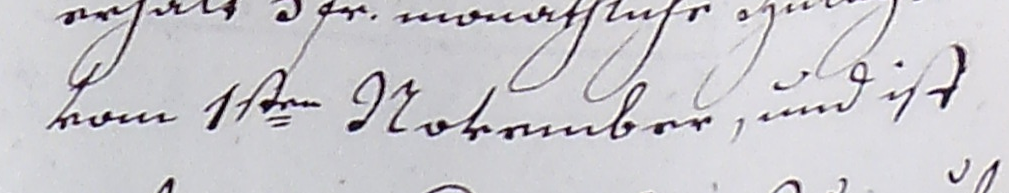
vom 1ste͇n November, und ist
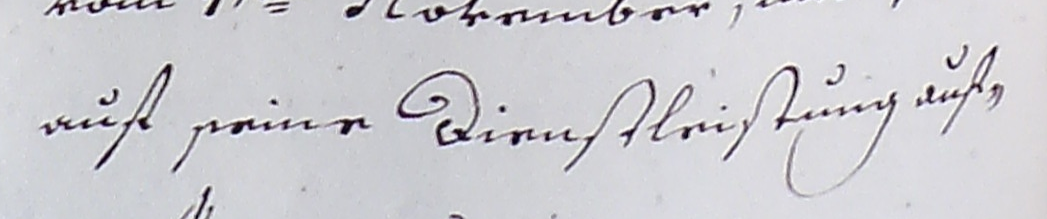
auf seine Dienstleistung auf¬
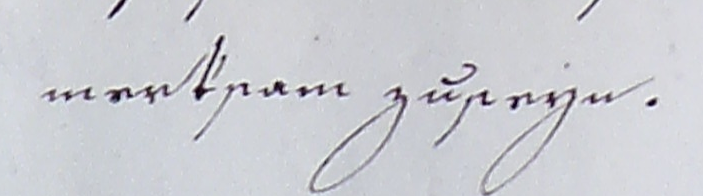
merksam zuseyn.
